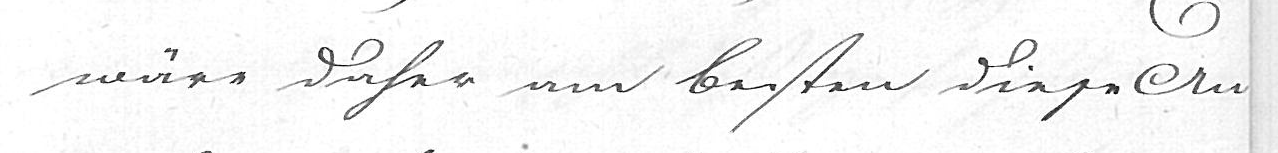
wäre daher am besten diese An-
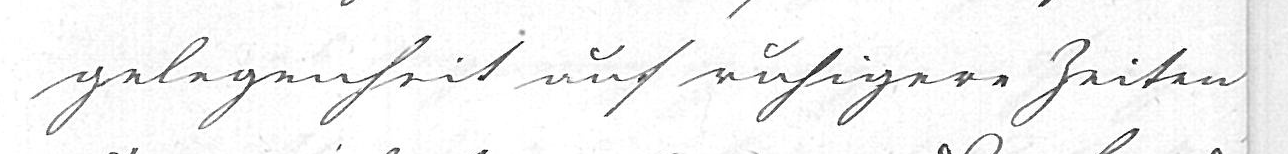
gelegenheit auf ruhigere Zeiten
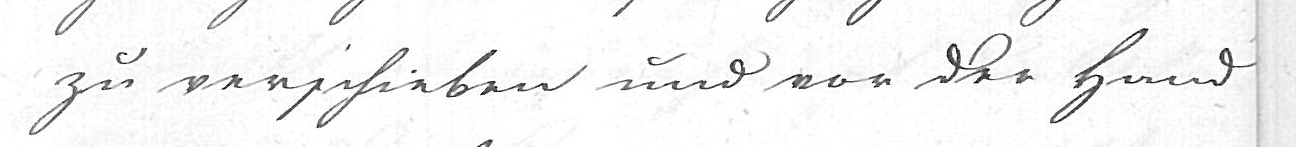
zu verschieben und vor der Hand
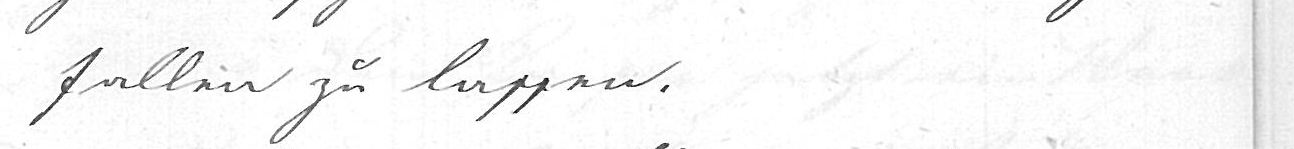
fallen zu lassen.
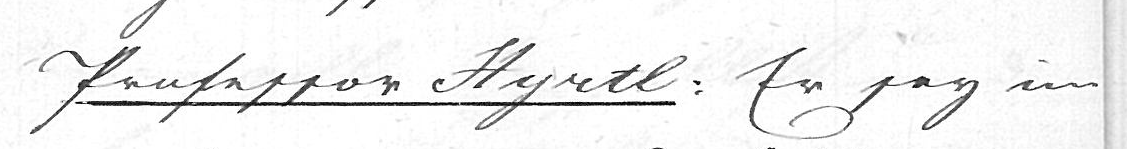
Professor Hyrtl: Er sey im
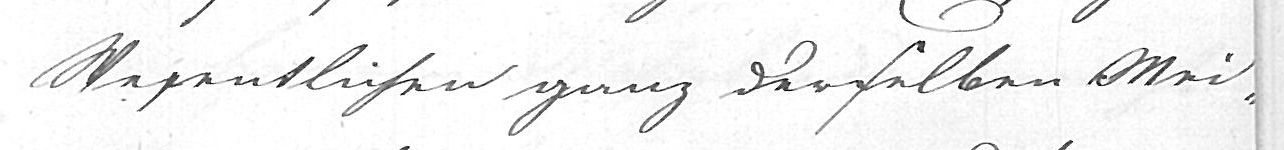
Wesentlichen ganz derselben Mei-
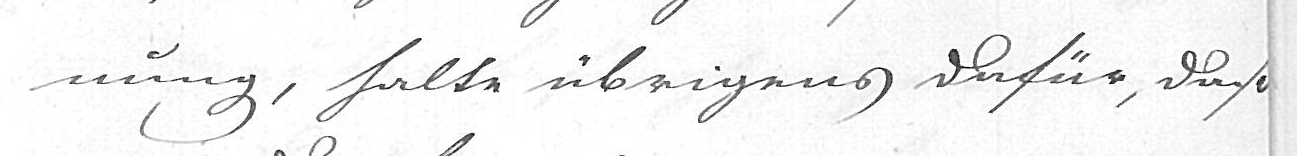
nung, halte übrigens dafür, daß
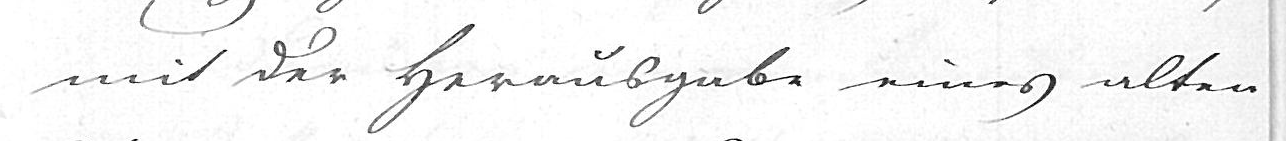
mit der Herausgabe eines alten
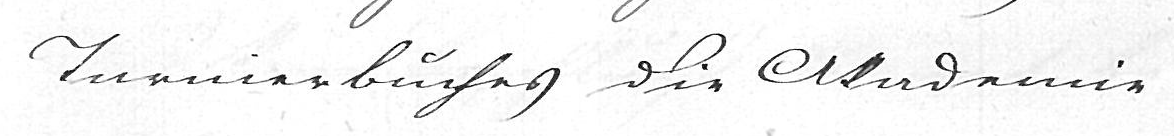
Turnierbuches die Akademie
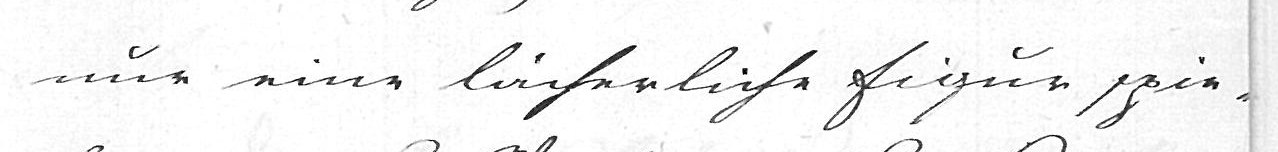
nur eine lächerliche Figur spie-
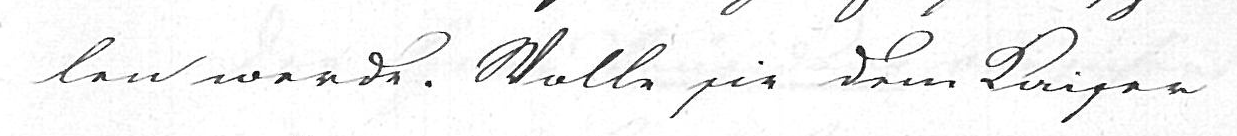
len werde. Wolle sie dem Kaiser
